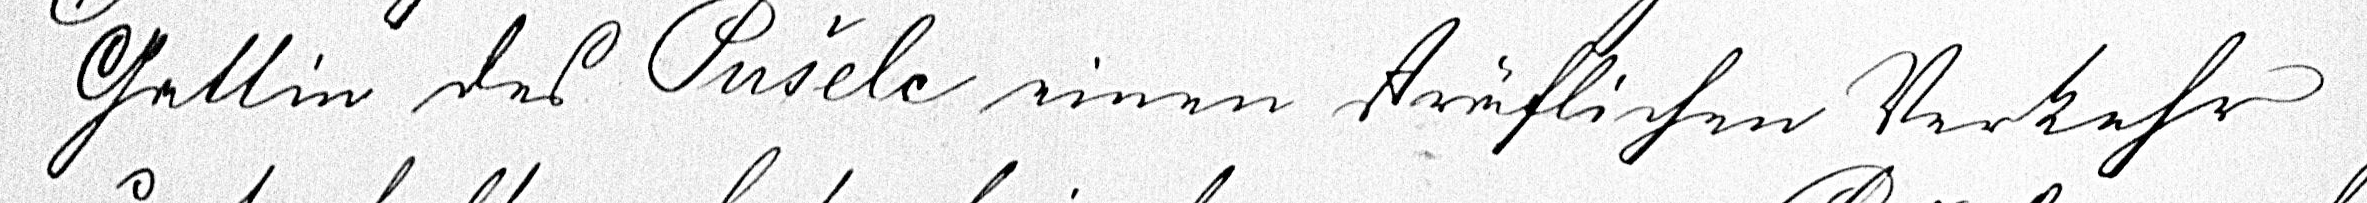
Gattin des Pušelc einen sträflichen Verkehr
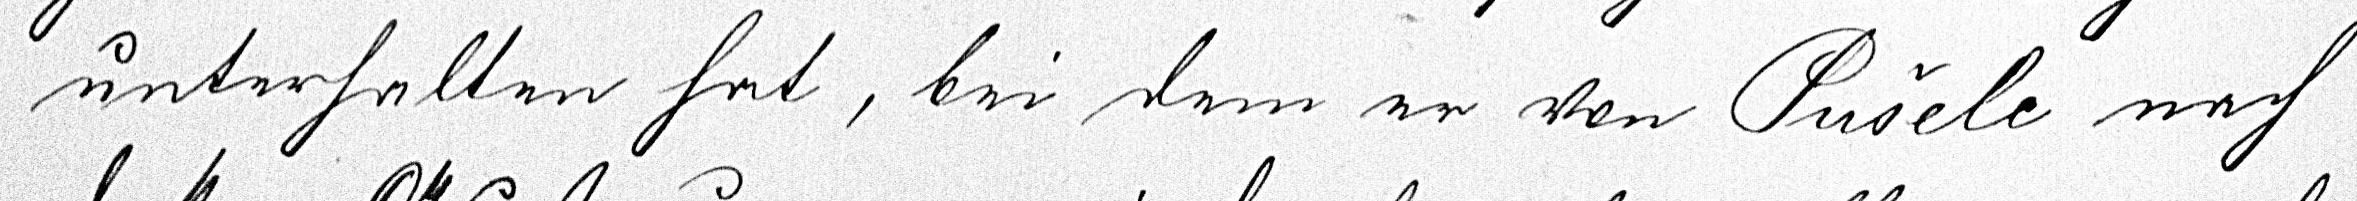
unterhalten hat, bei dem er von Pušelc nach
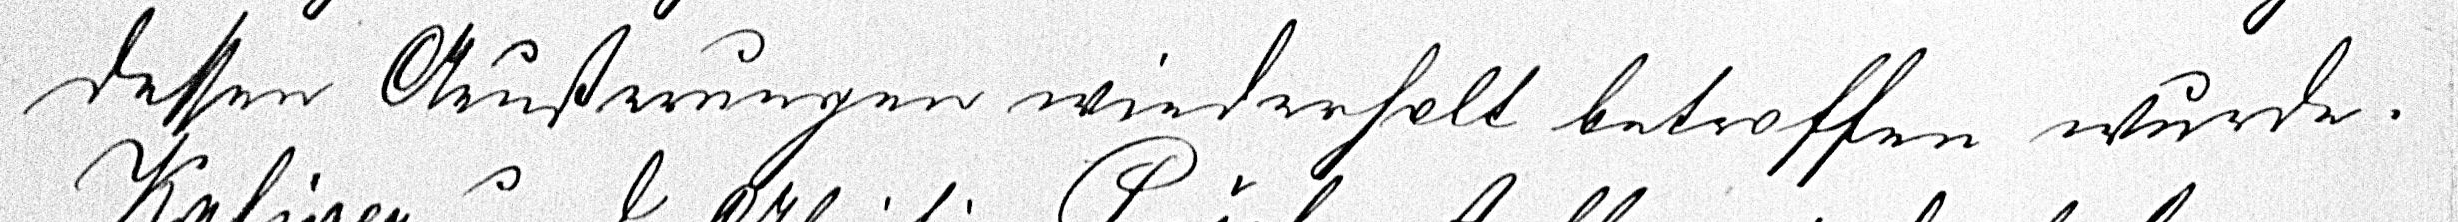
dessen Aeußerungen wiederholt betroffen wurde.
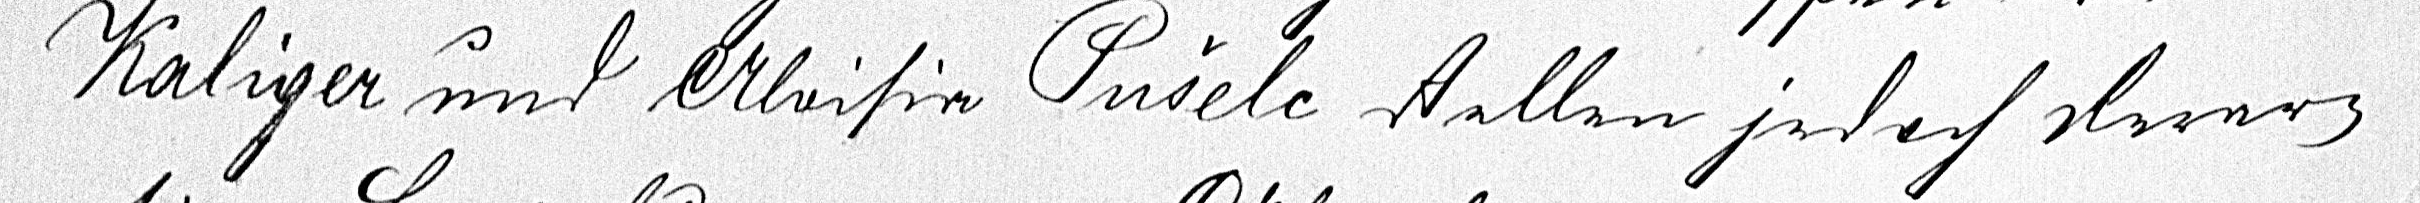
Kaliger und Aloisia Pušelc stellen jedoch Verer¬
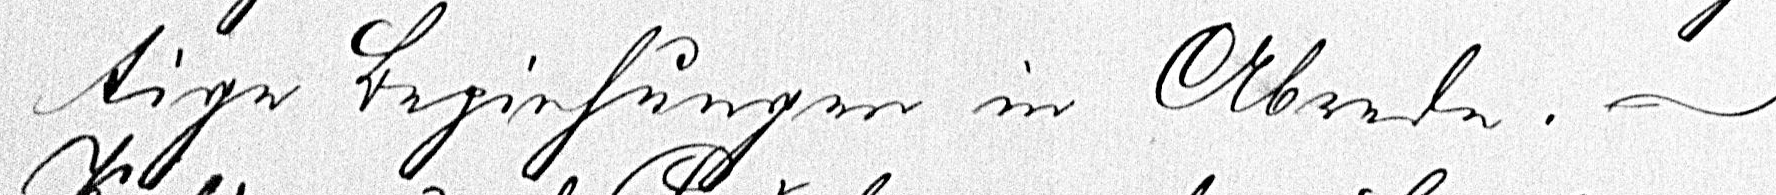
tige Beziehungen in Abrede.
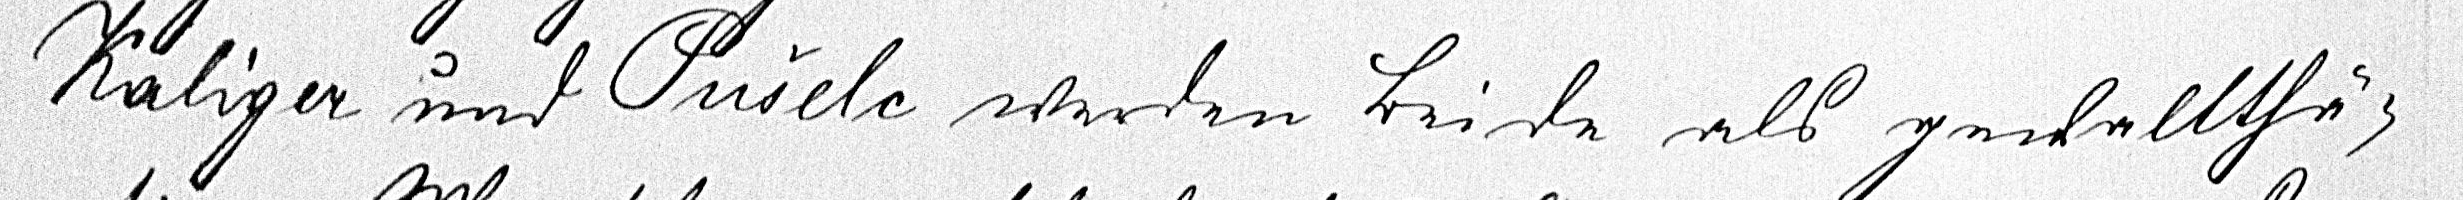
Kaliger und Pušelc werden beide als gewaltthä¬
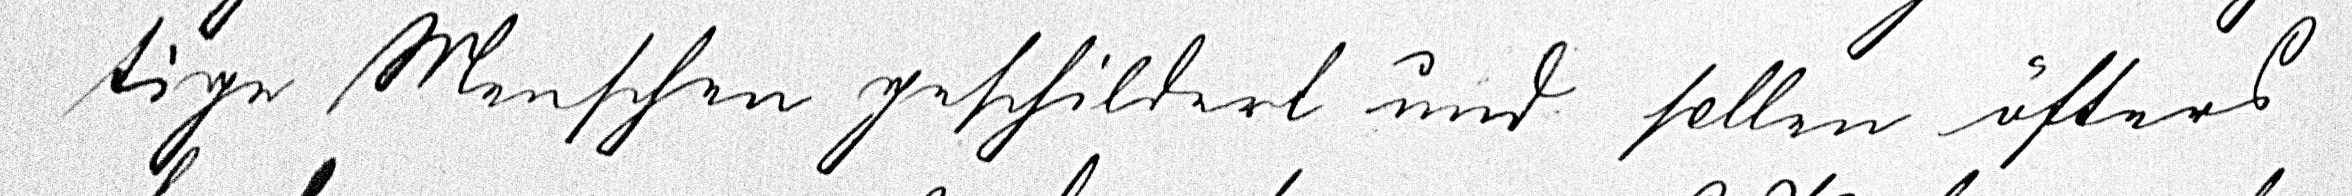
tige Menschen geschildert und sollen öfters
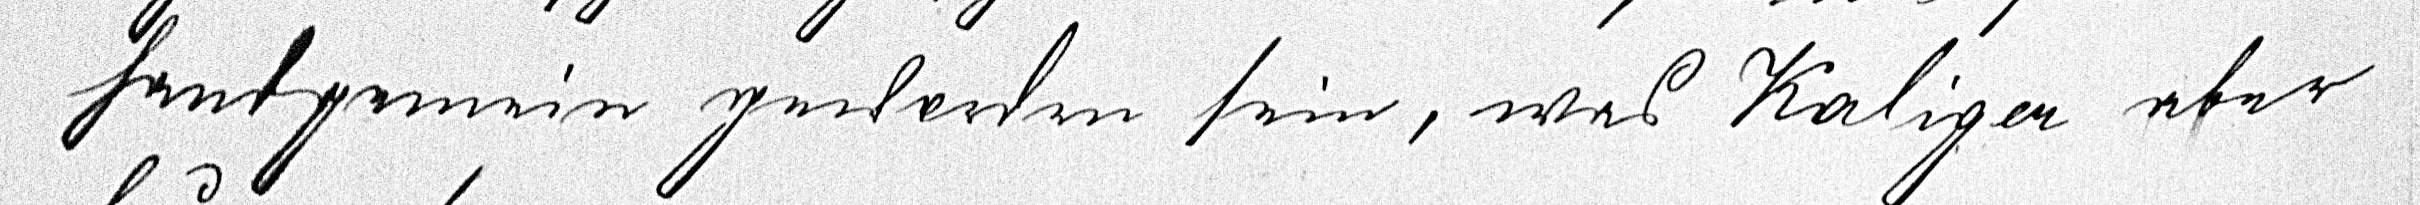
Handgemein geworden sein, was Kaliger aber
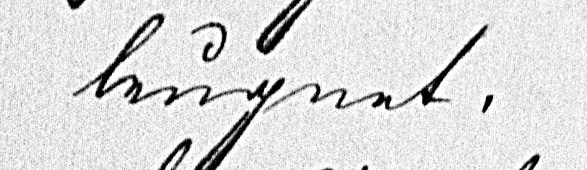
leugnet.
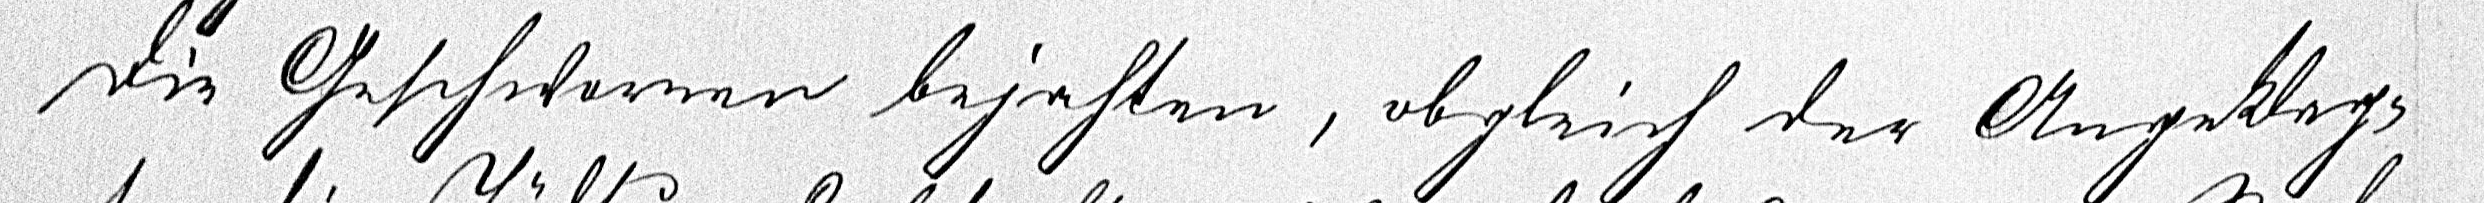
Die Geschwornen bejahten, obgleich der Angeklag¬
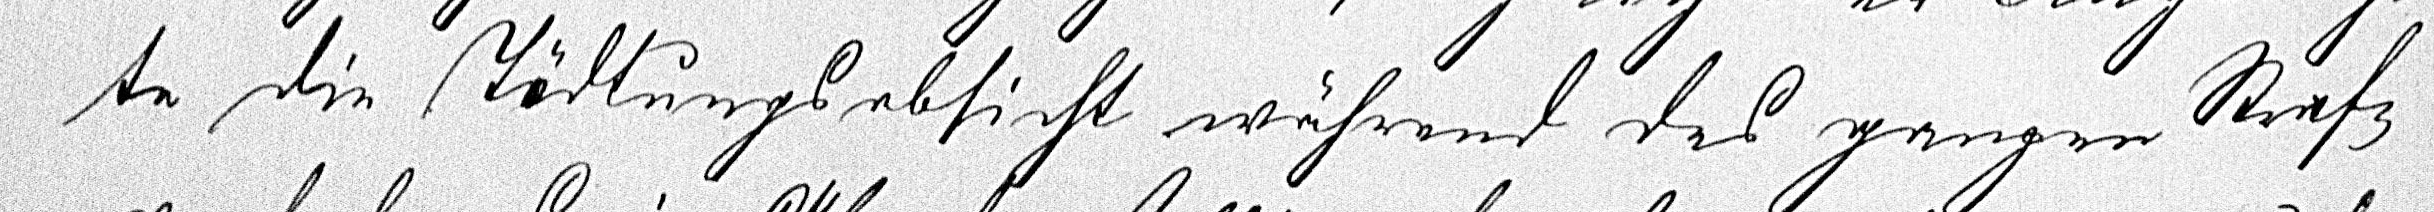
te die Tödtungsabsicht während des ganzen Straf¬
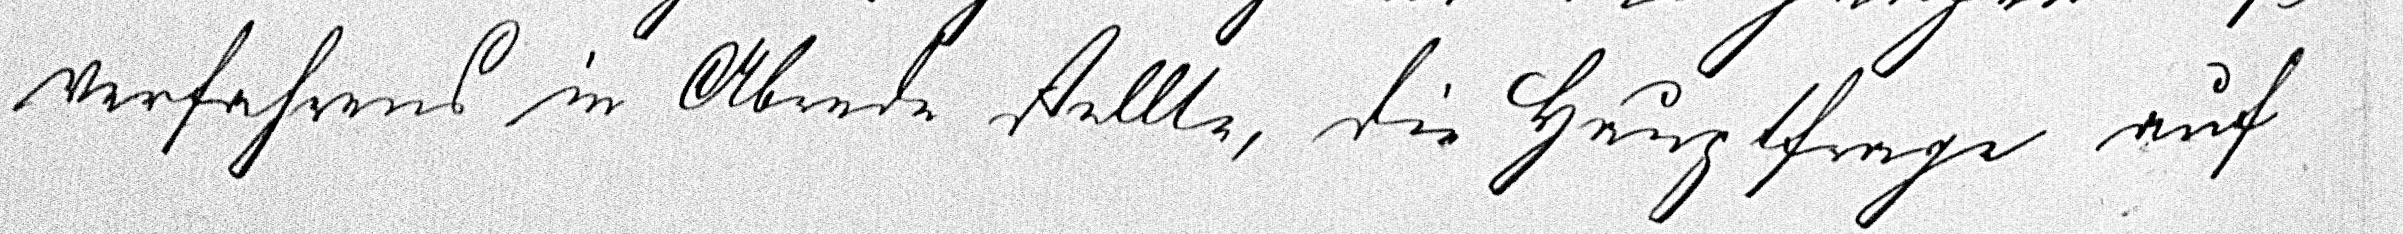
verfahrens in Abrede stellte, die Hauptfrage auf
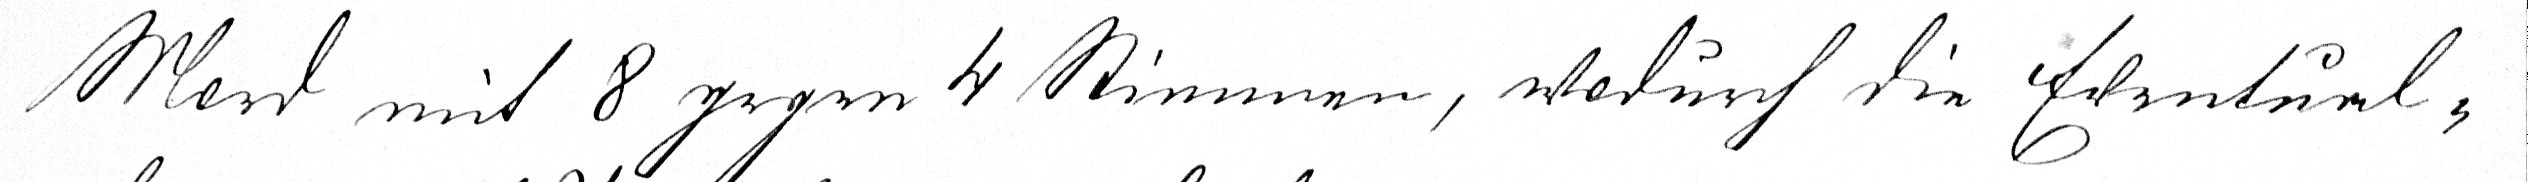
Mord mit 8 gegen 4 Stimmer, wodurch die Eventual¬
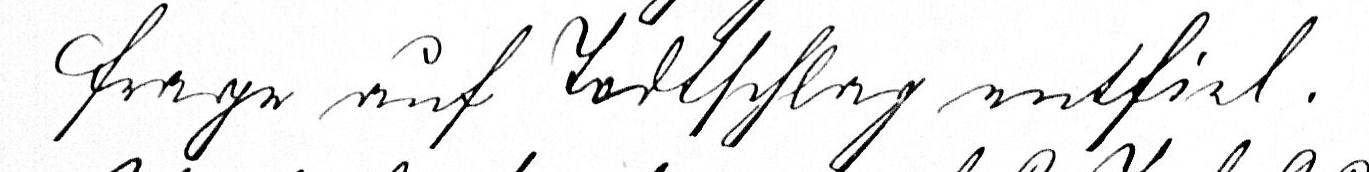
frage auf Todtschlag entfiel.
